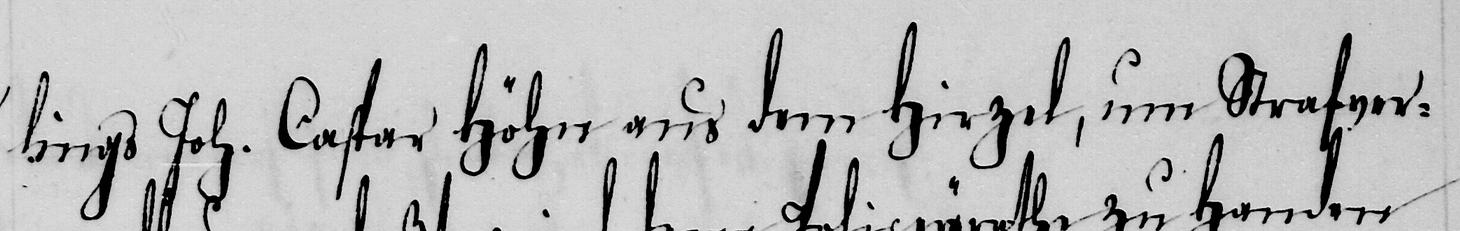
lings Joh. Caspar Höhn aus dem Hirzel, um Strafver¬
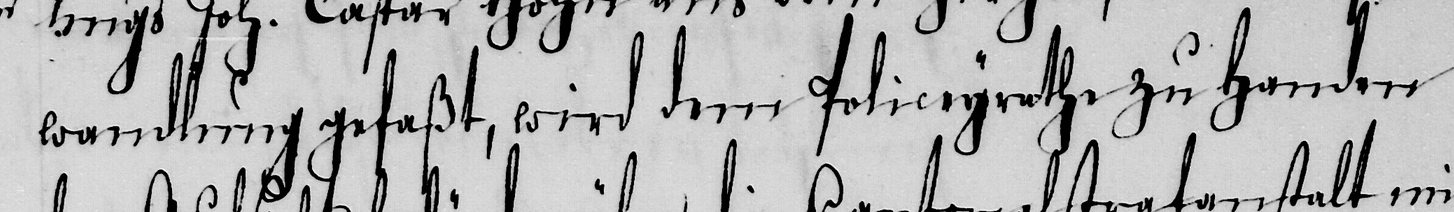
wandlung gefaßt, wird dem Policeyrathe zu Handen
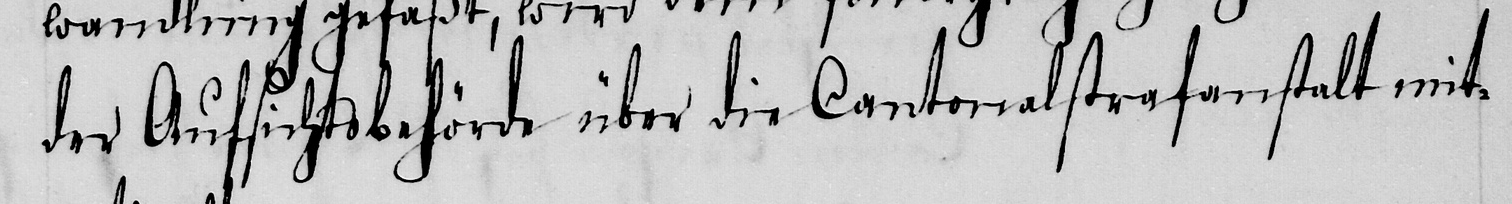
der Aufsichtsbehörde über die Cantonalstrafanstalt mit¬
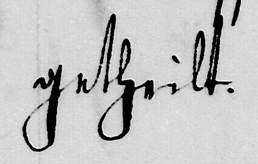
getheilt.
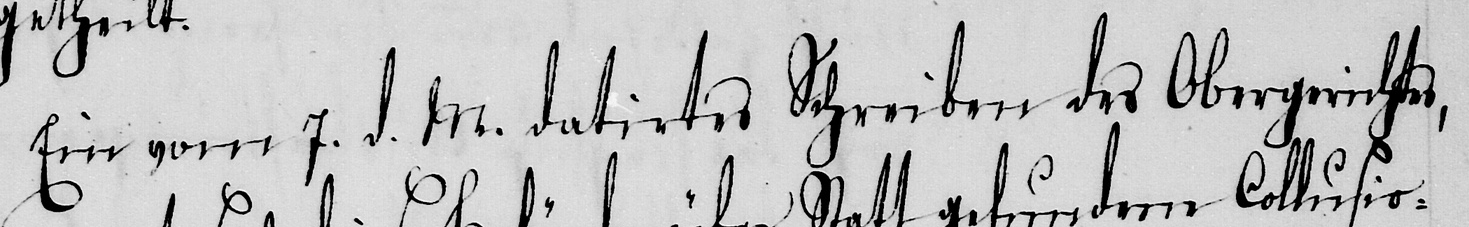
Ein vom 7. d. M. datirtes Schreiben des Obergerichtes,
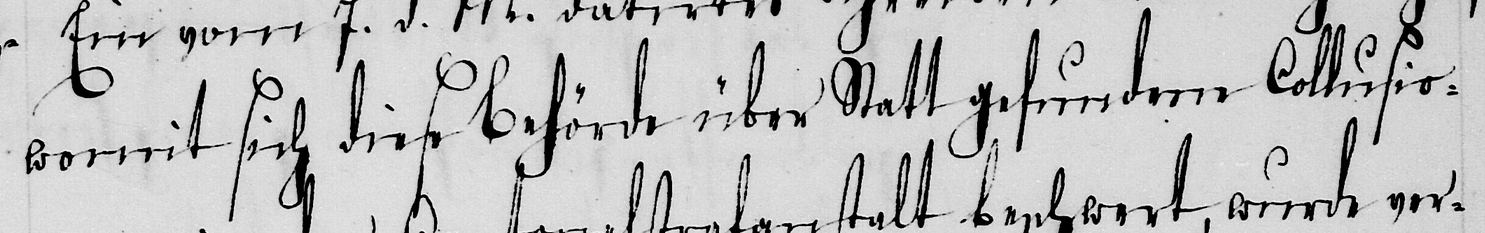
womit sich diese Behörde über Statt gefundene Collusio¬
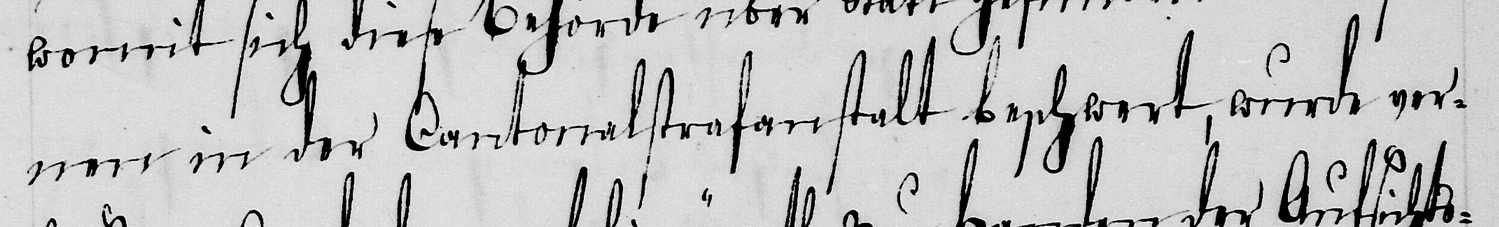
nen in der Cantonalstrafanstalt beschwert, wurde ver¬
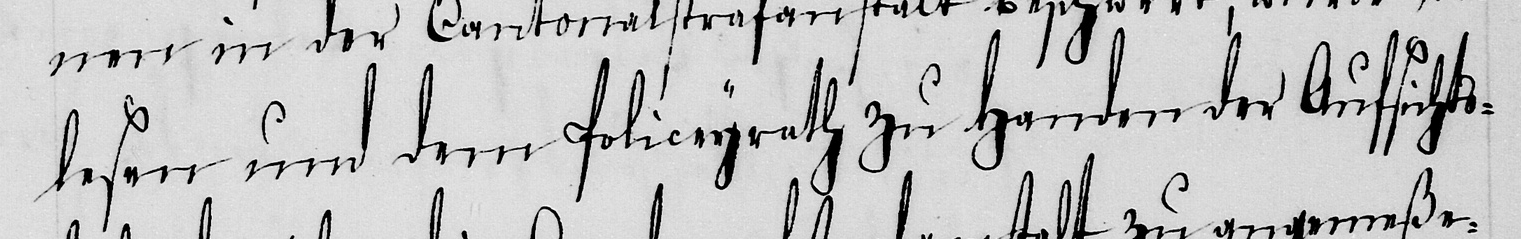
lesen und dem Policeyrath zu Handen der Aufsicht¬
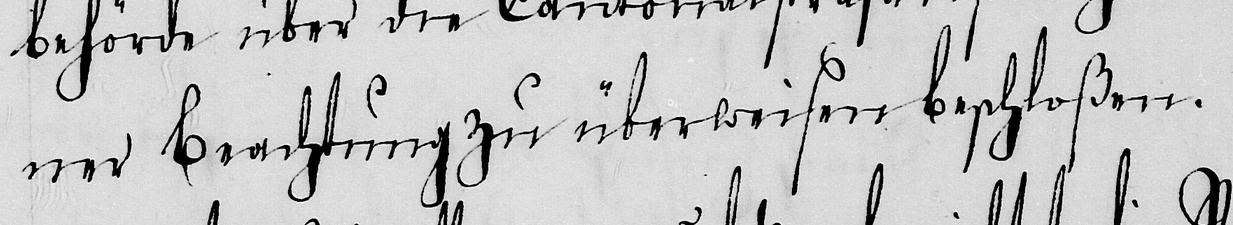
ner Beachtung zu überweisen beschloßen.
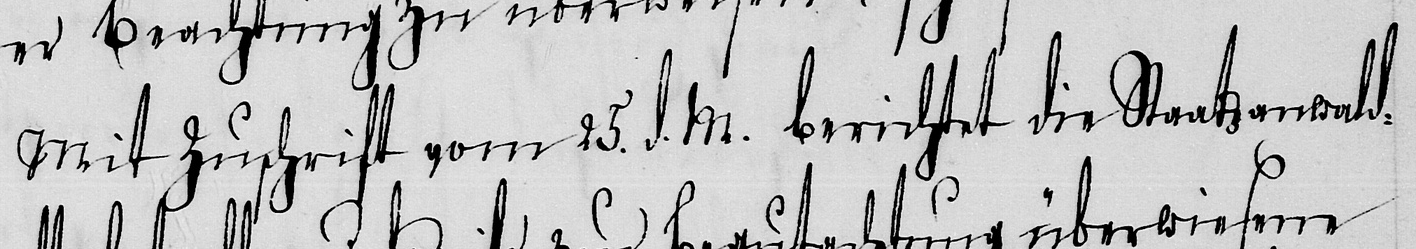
Mit Zuschrift vom 25. d. M. berichtet die Staatsanwal¬
